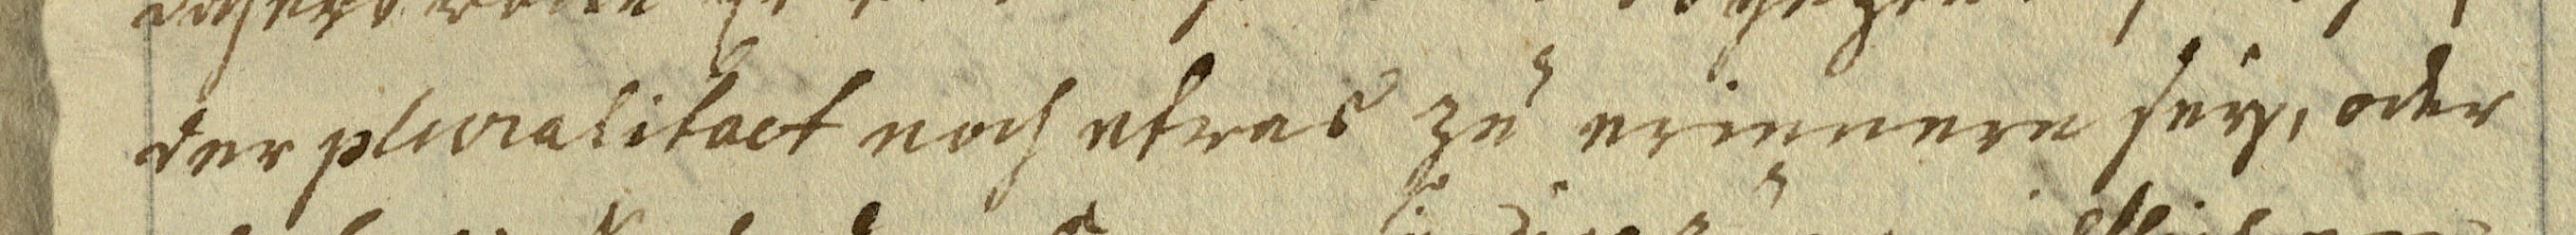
der pluralitaet noch etwas zu erinner seÿ, oder
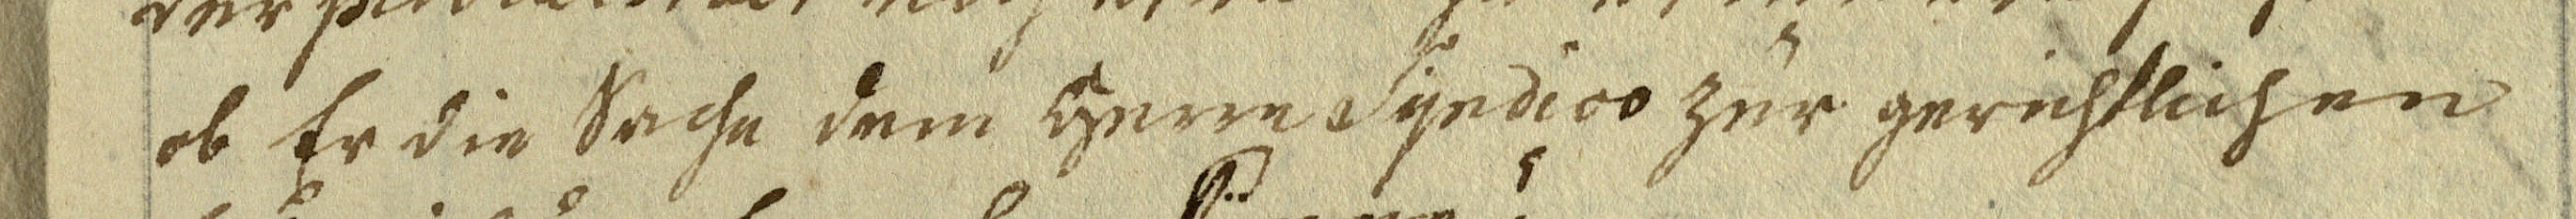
ob Er die Sache dem Herrn Sÿndico zur gerichtlichen
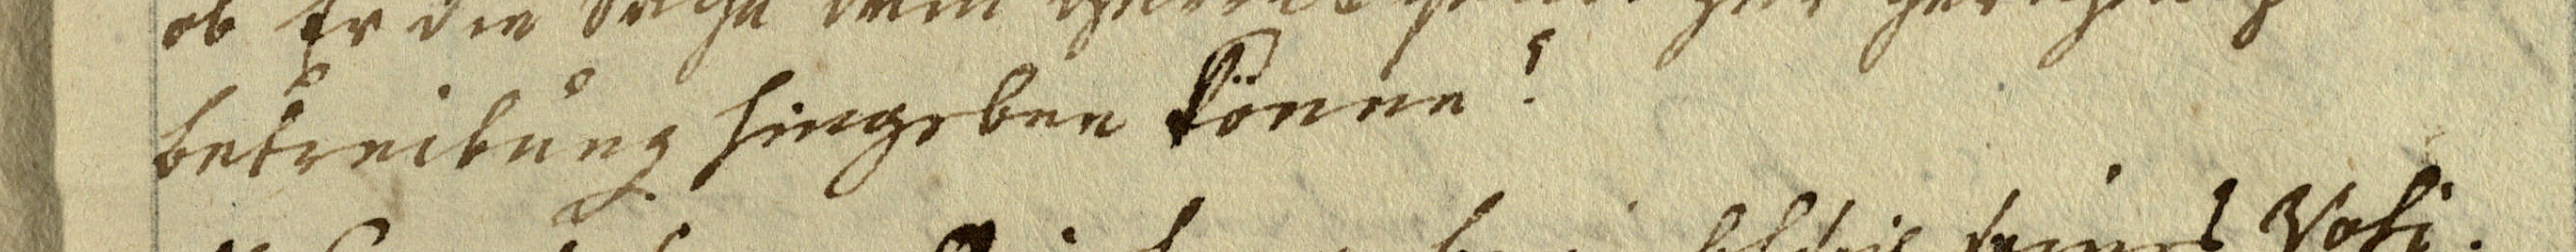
Betreibung hingeben könne?
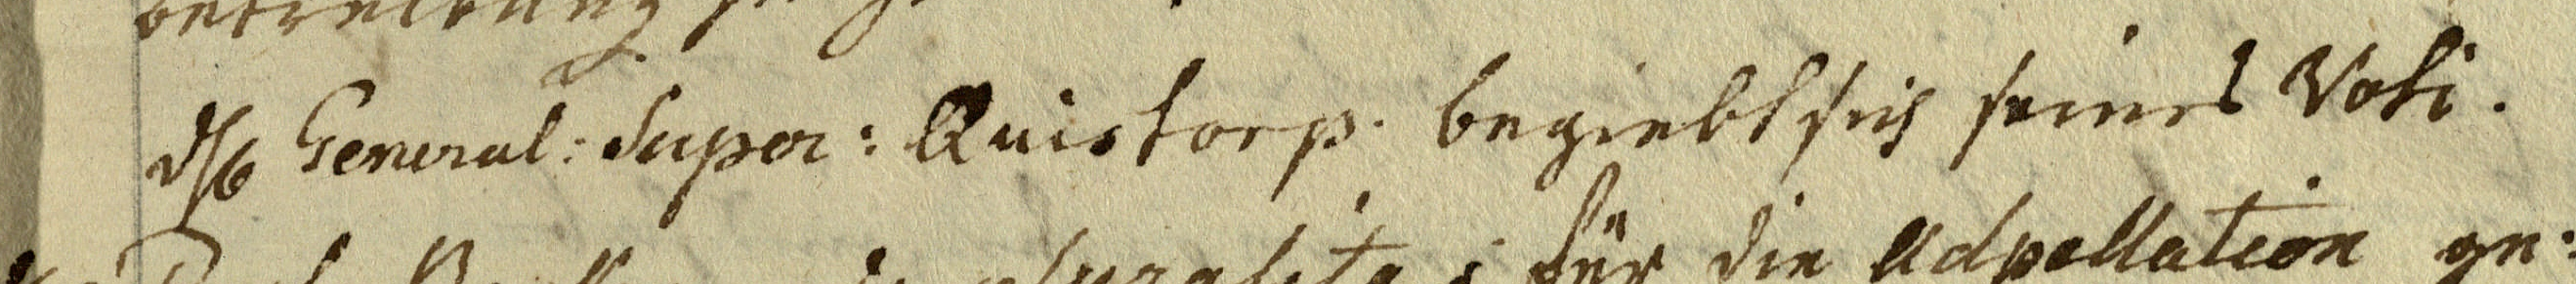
dh General.Super. Quistorp begiebt sich seines Voti.
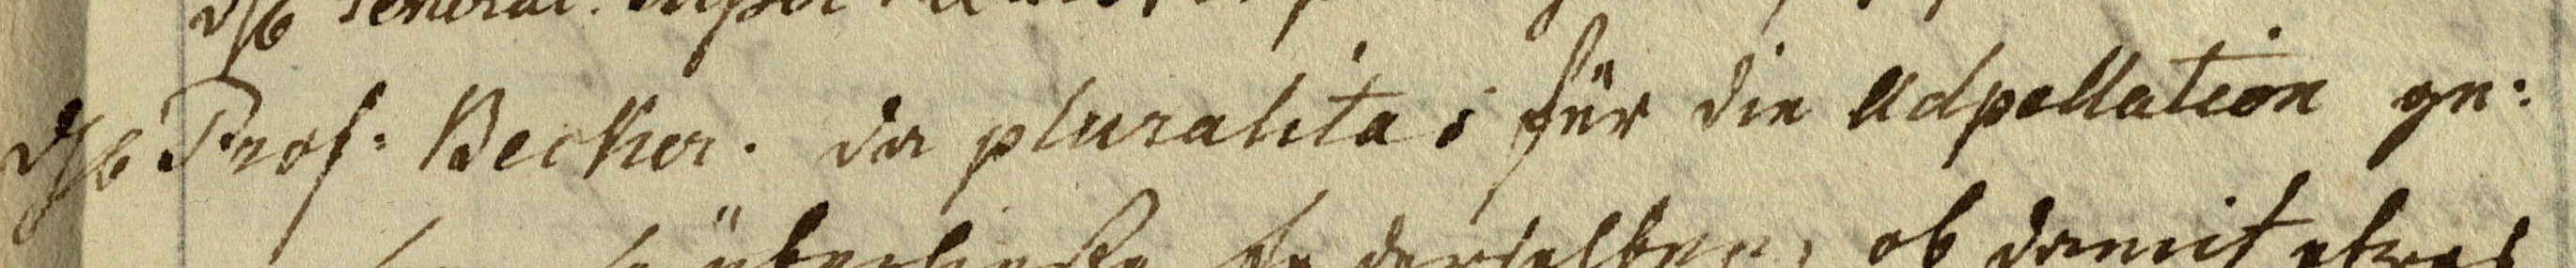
dh. Prof. Becker. da pluralitas für die Adpellation ge¬
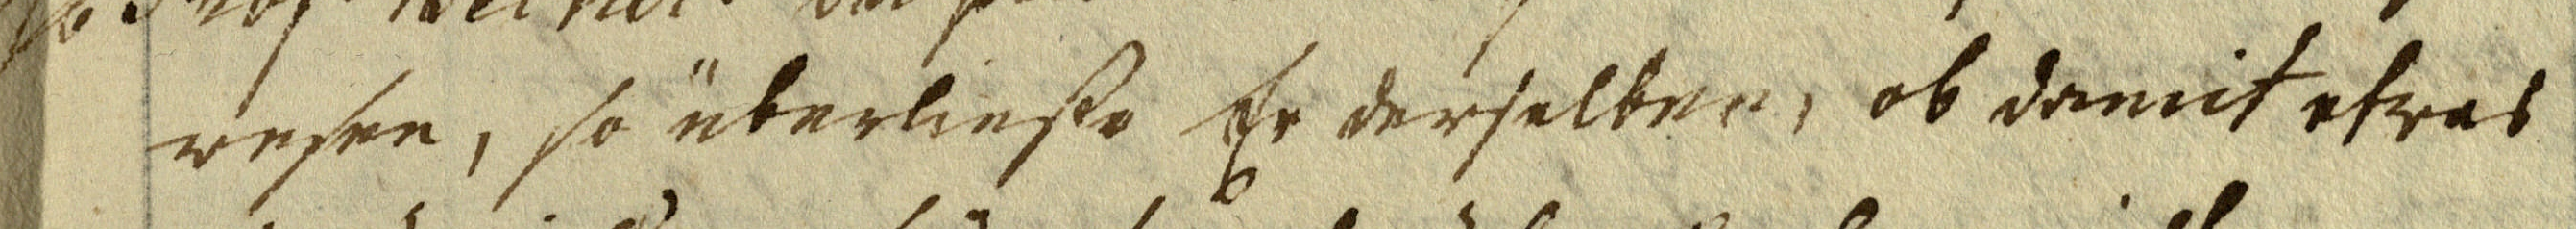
wesen, so überließe Er derselben, ob damit etwas
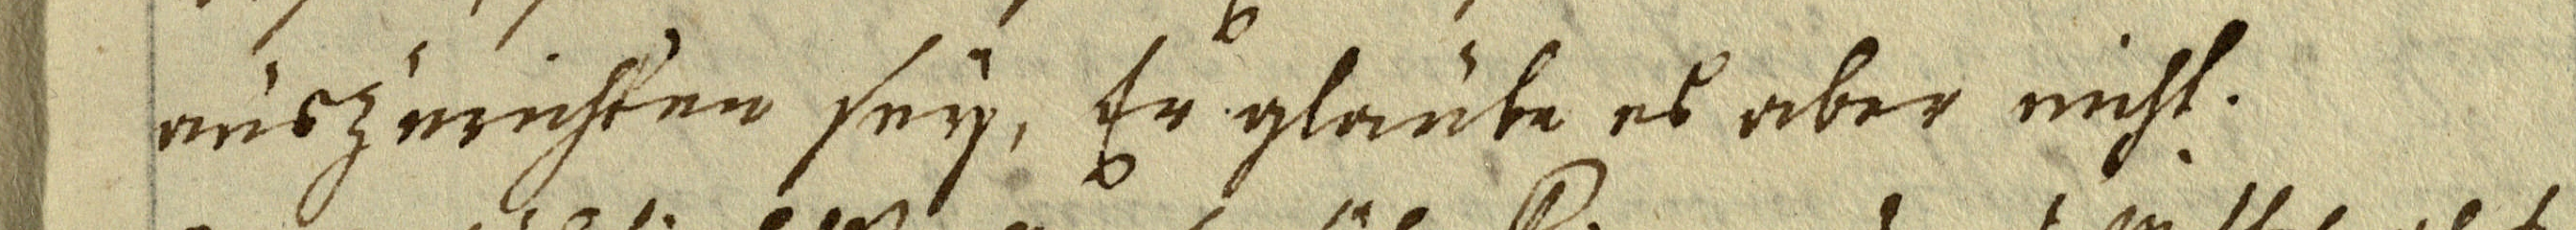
auszurichten seÿ, Er glaube aber nicht.
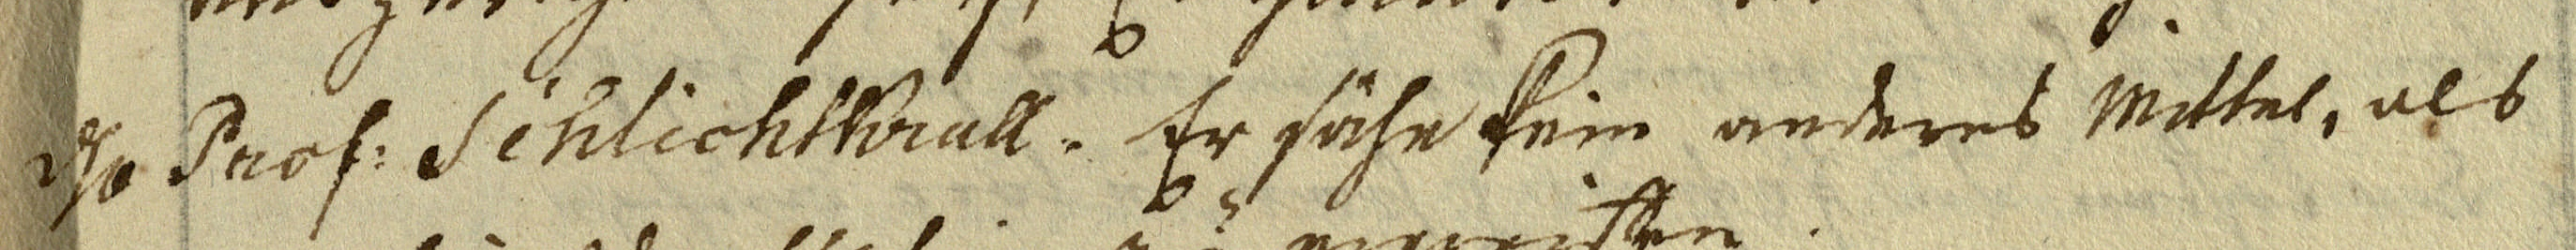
dh. Prof. Schlichtkrull. Er sähe kein anderes Mittel, als
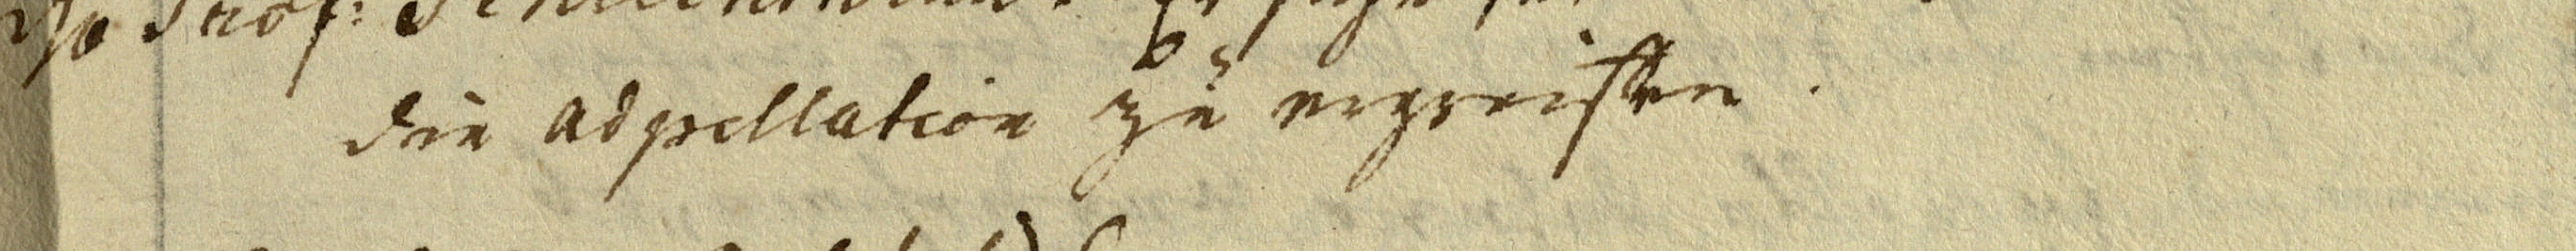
die Adpellation zu ergreifen.
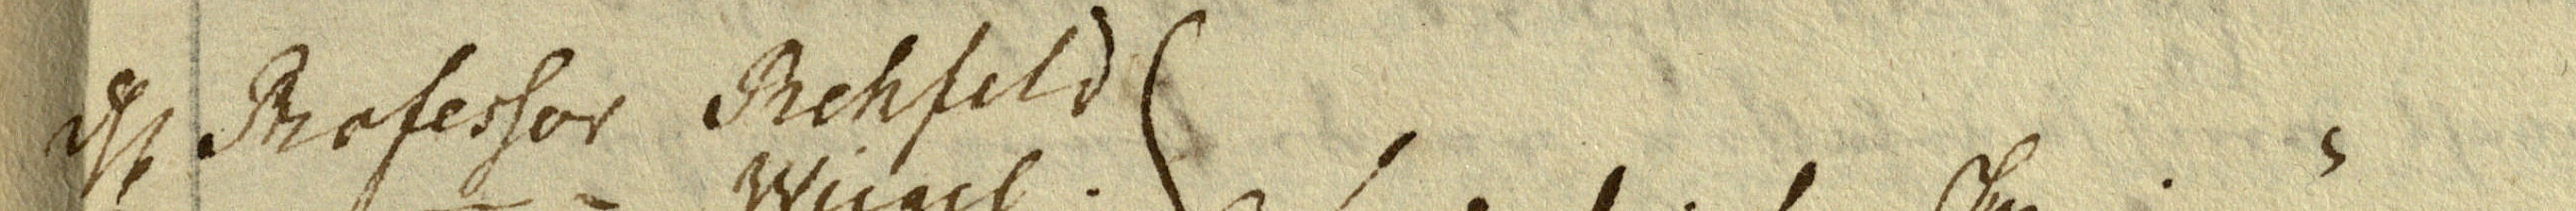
dh Professor Rehleld
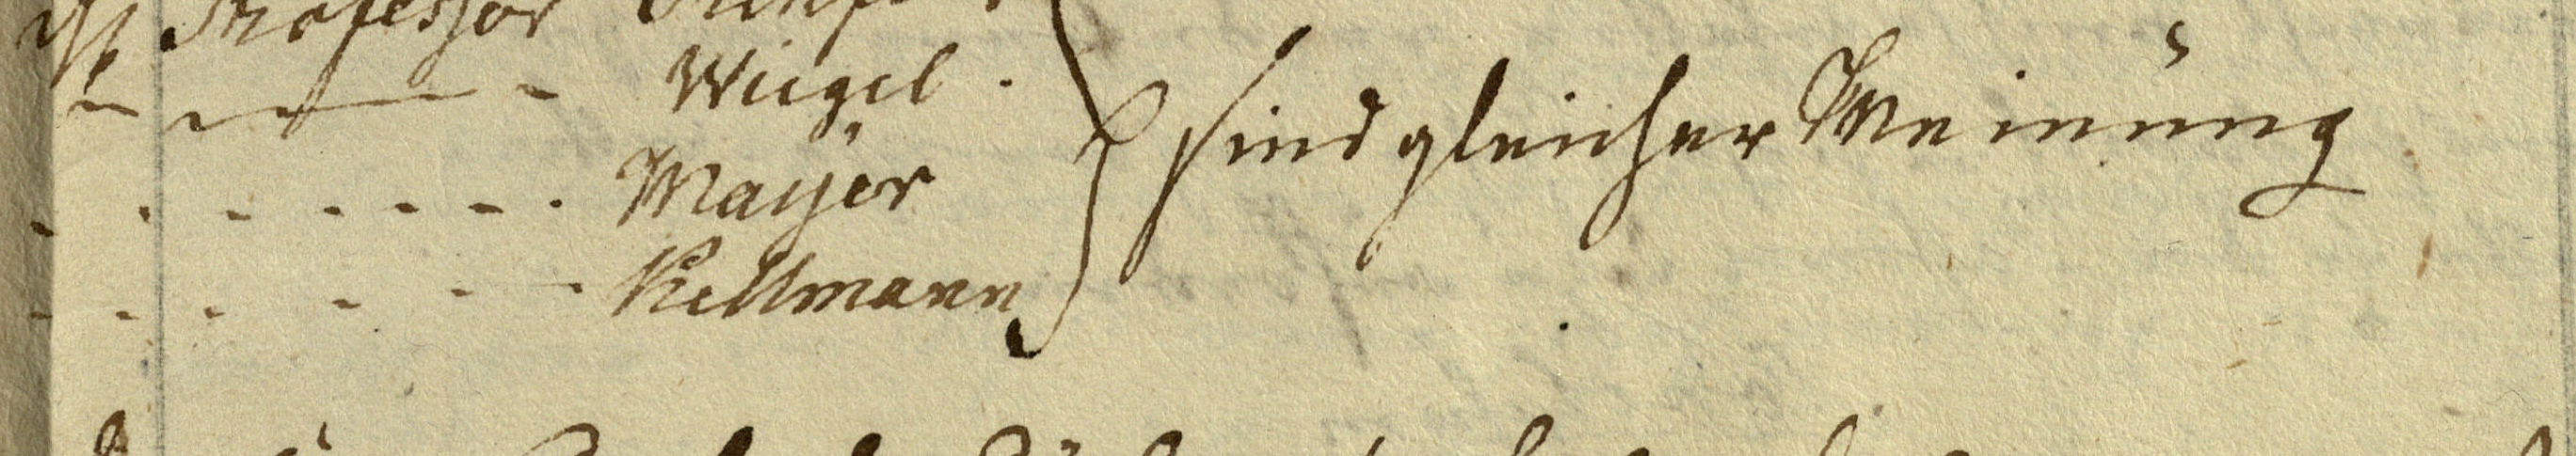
Weigel sind gleicher Meinung
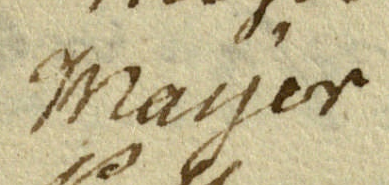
Maÿer
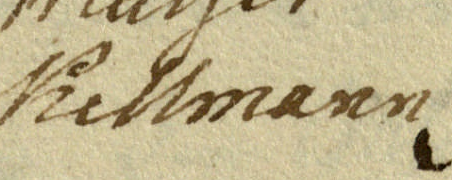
Kellmann
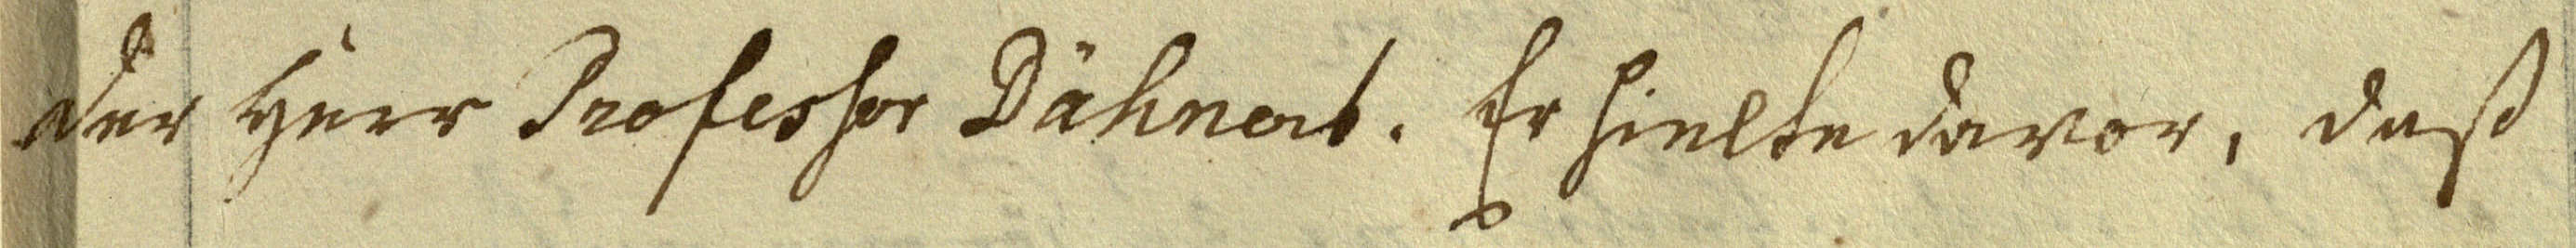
der Herr Professor Dähnert. Er hielte davor, daß
